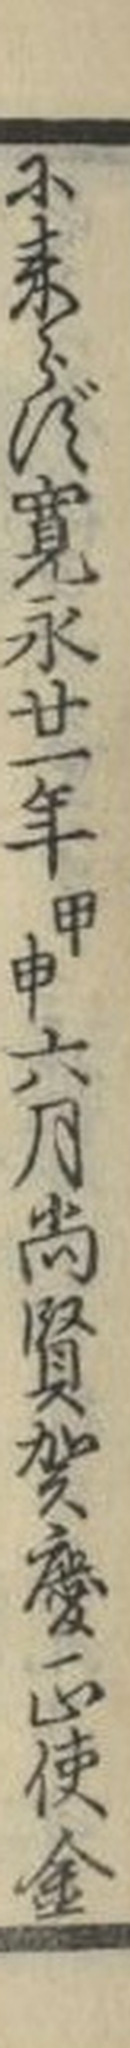に来らず寛永廿一年甲申六月尚賢賀慶正使金
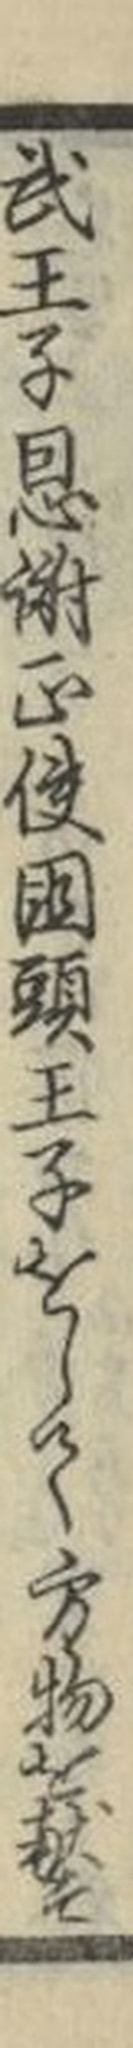武王子恩謝正使国頭王子をして方物を献す
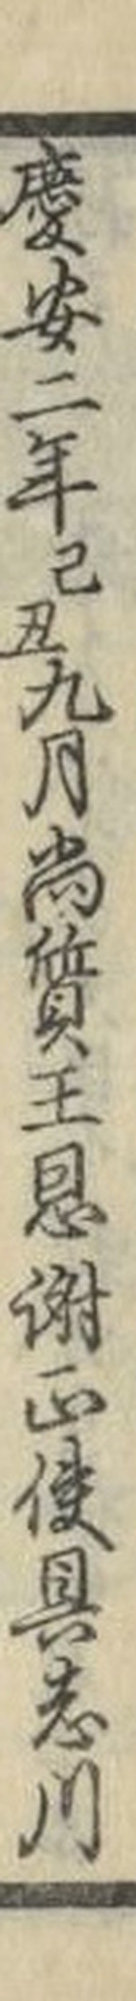慶安二年己丑九月尚質王恩謝正使具志川
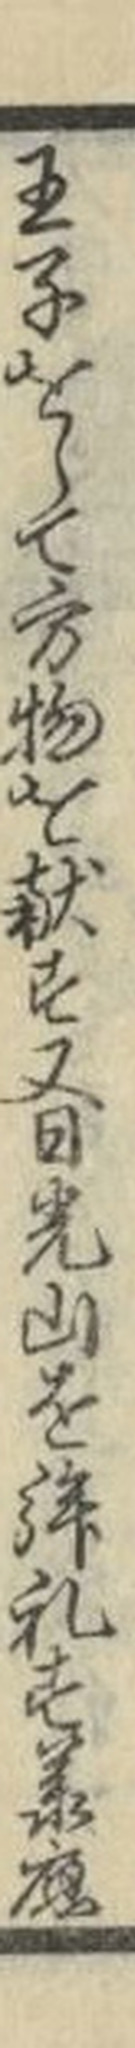王子をして方物を献す又日光山を拝礼す承応
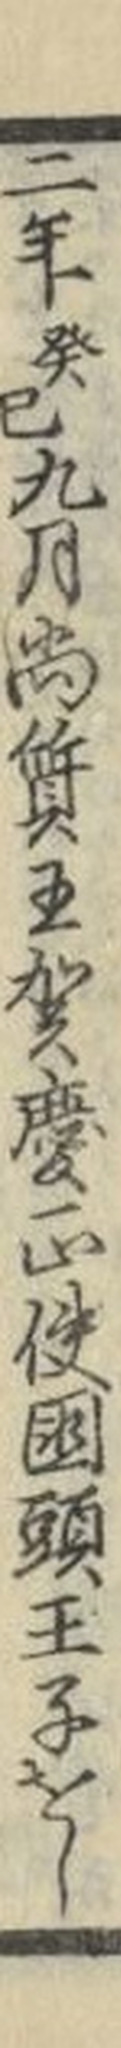二年癸巳九月尚質王賀慶正使国頭王子をし
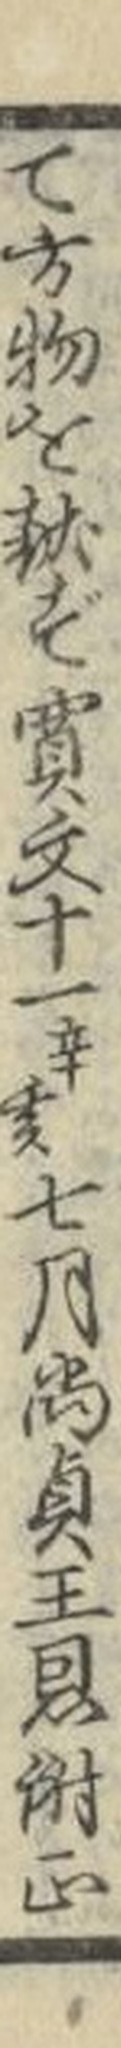て方物を献ず寛文十一辛亥七月尚貞王恩謝正
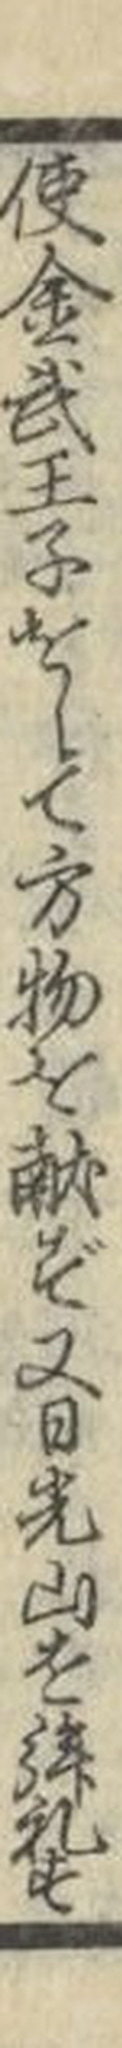使金武王子をして方物を献ず又日光山を拝礼す
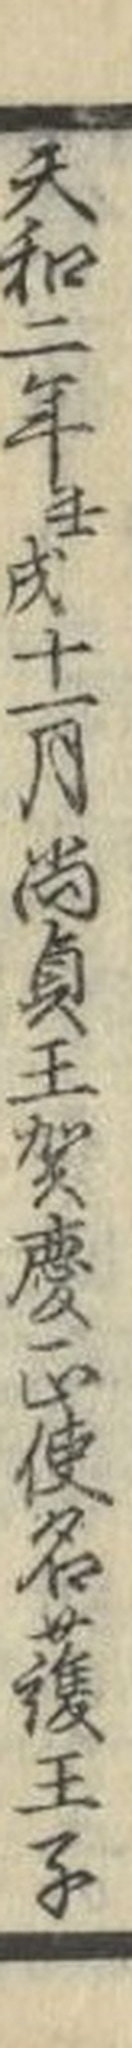天和二年壬戌十一月尚貞王賀慶正使名護王子
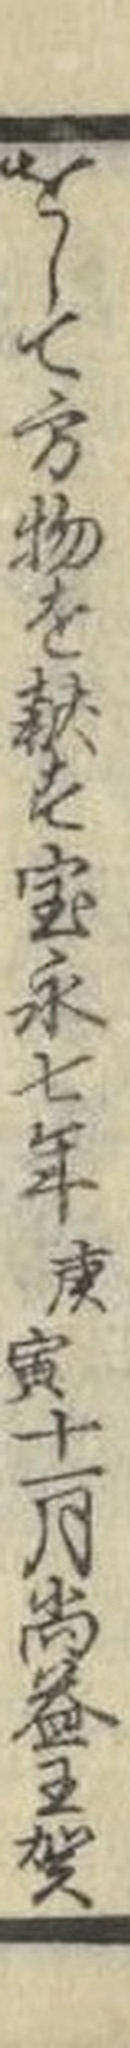をして方物を献す宝永七年庚寅十一月尚益王賀
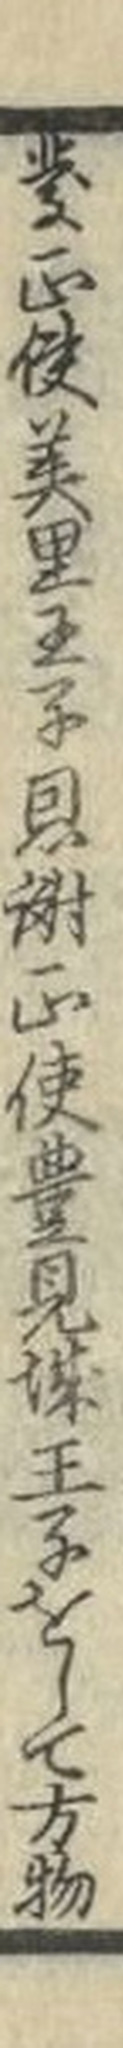慶正使美里王子恩謝正使豊見城王子をして方物
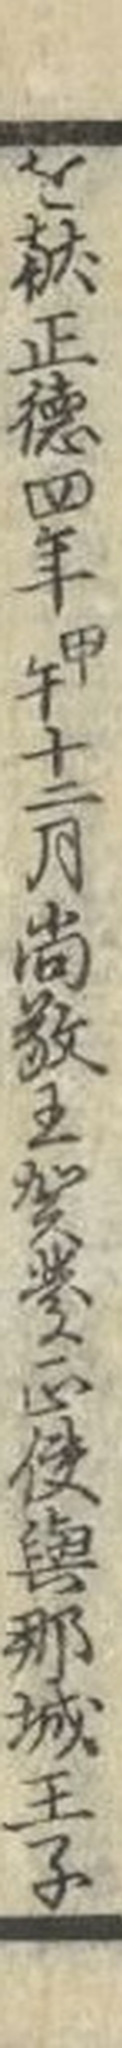を献正徳四年甲午十二月尚敬王賀慶正使与那城王子
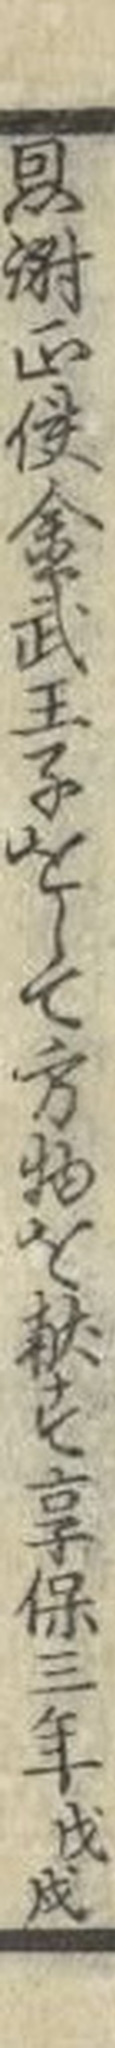恩謝正使金武王子をして方物を献す享保三年戊戌
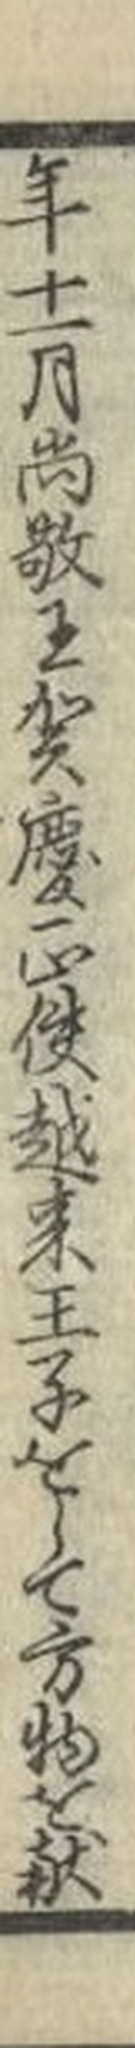年十一月尚敬王賀慶正使越来王子をして方物を献
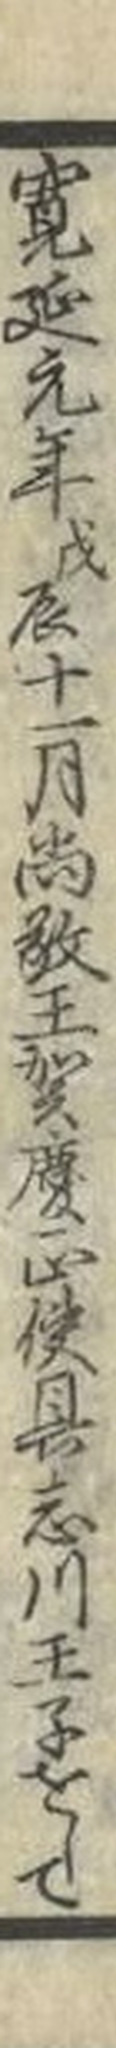寛延元年戊辰十一月尚敬王賀慶正使具志川王子をして
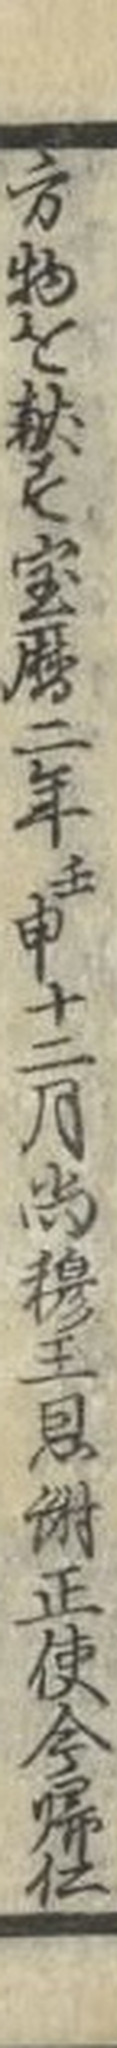方物を献す宝暦二年壬申十二月尚穆王恩謝正使今帰仁
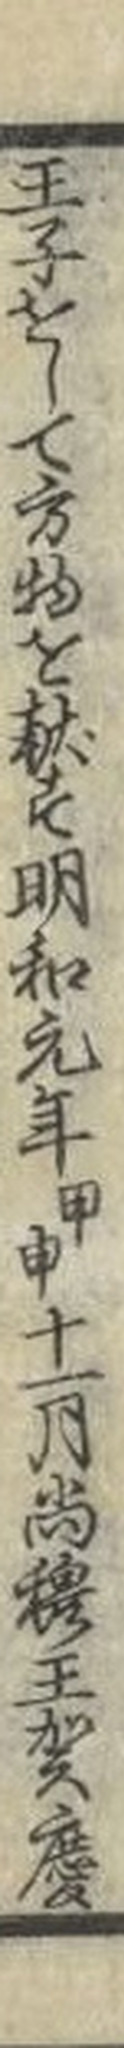王子をして方物を献す明和元年甲申十一月尚穆王賀慶
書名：琉球解語
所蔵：University of the Ryukyus Library
